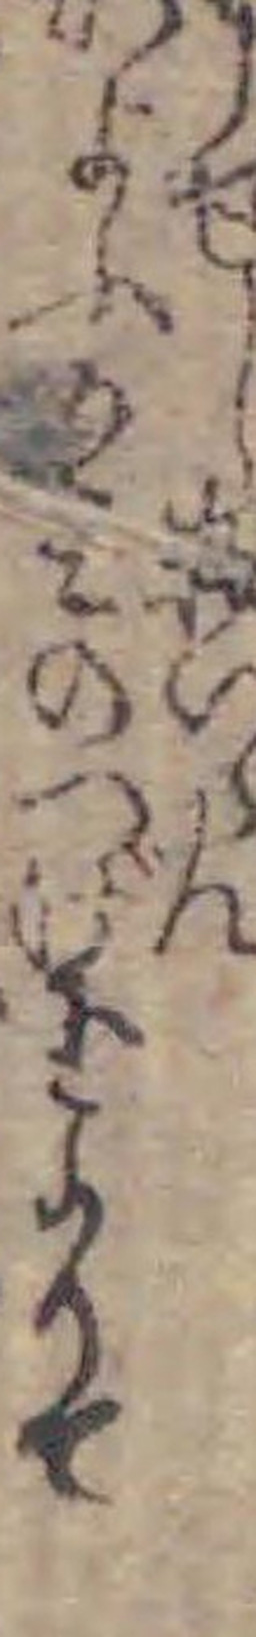かよふかみのつげによりて
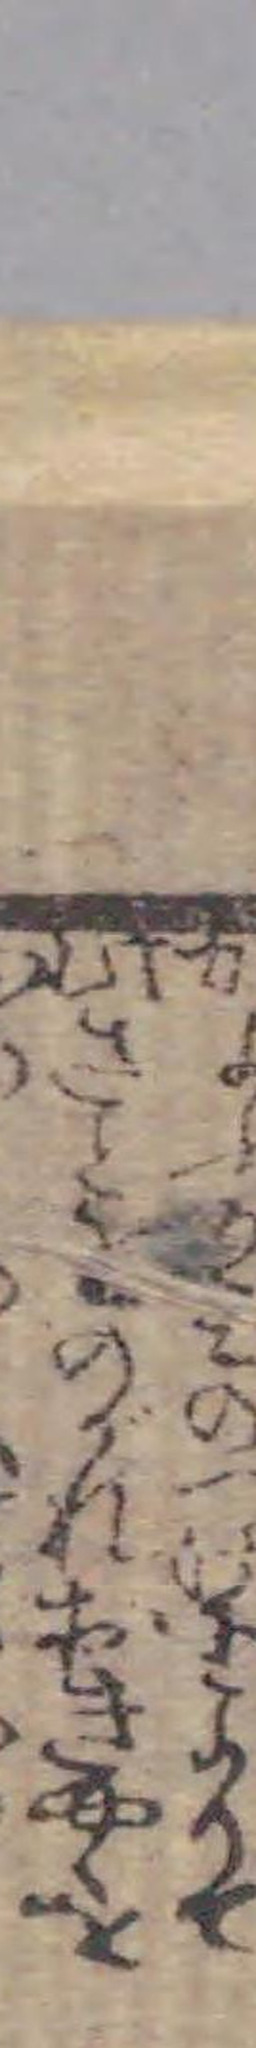此さとをのがれおきやくを
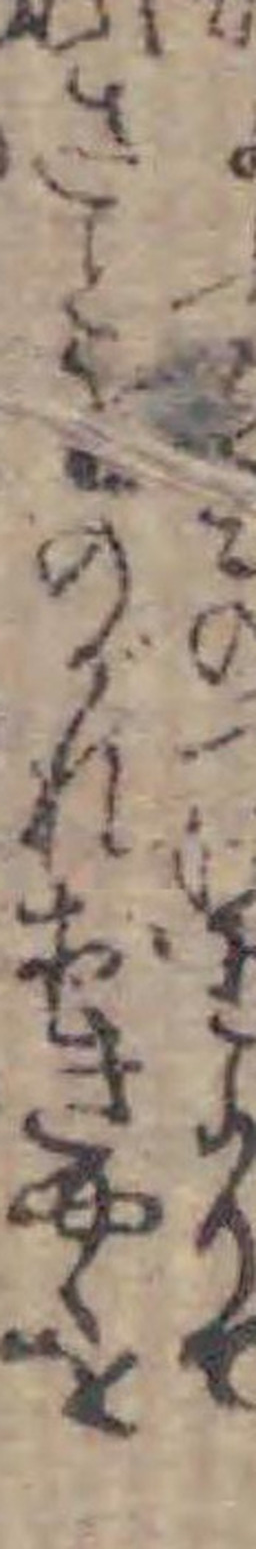此さとをのがれおきやくを
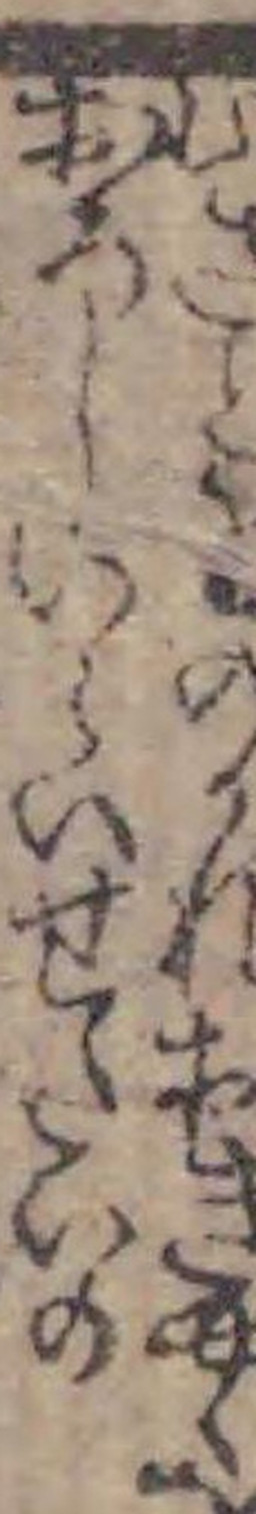おろしいらいせたいの
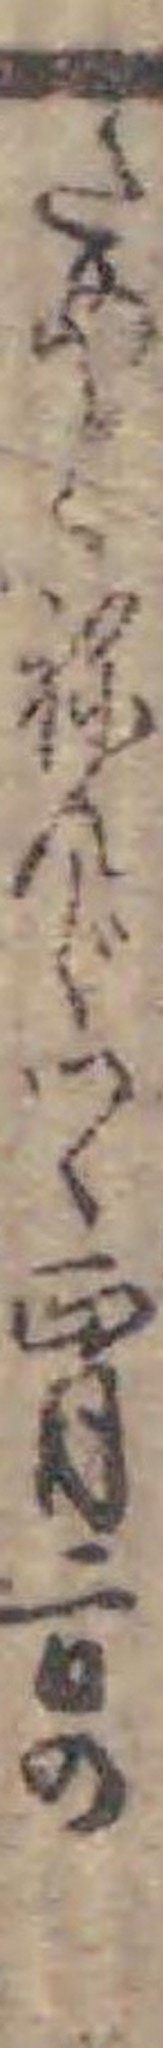ためとねんじつゝ正月二日の
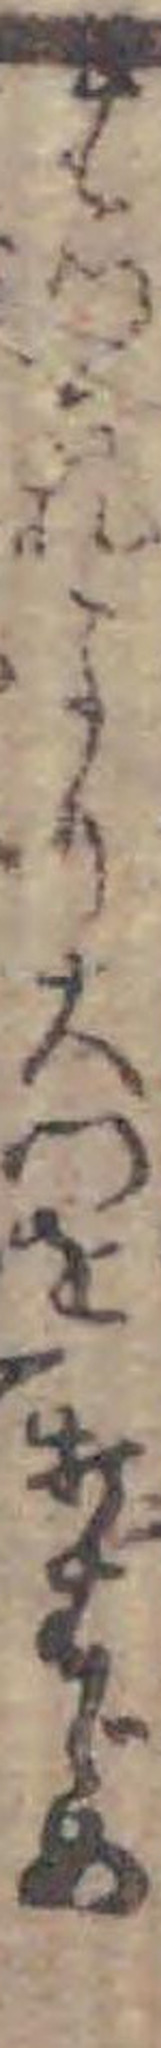はつ礼より大門を打はじめ
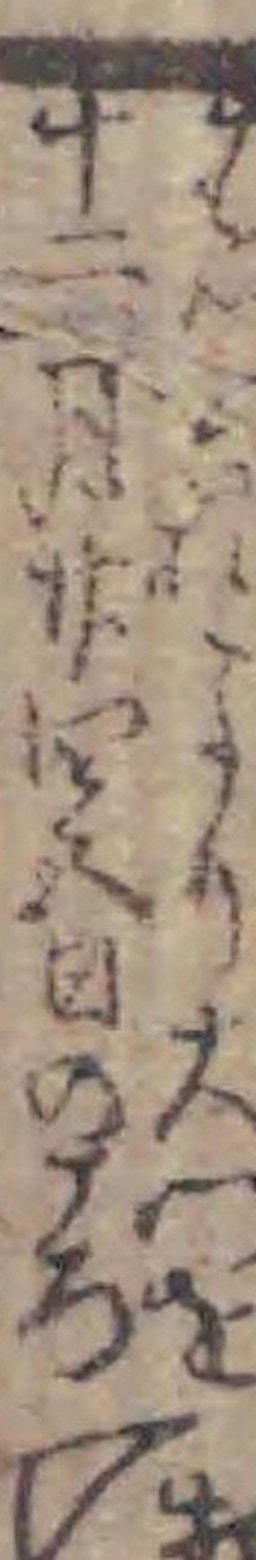十二月廿四五日のころ
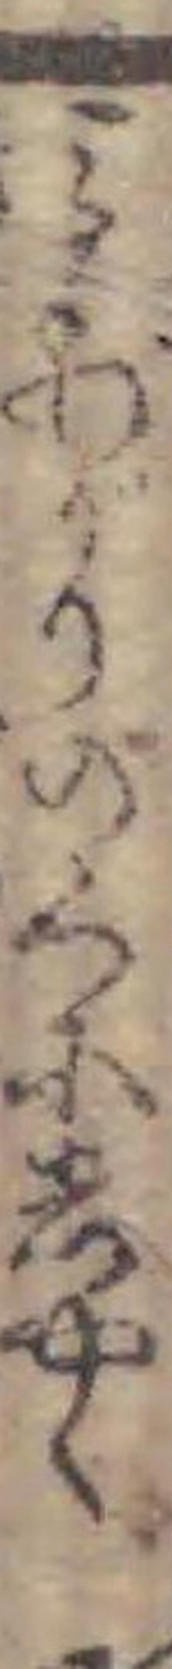みあがりのくにしやく
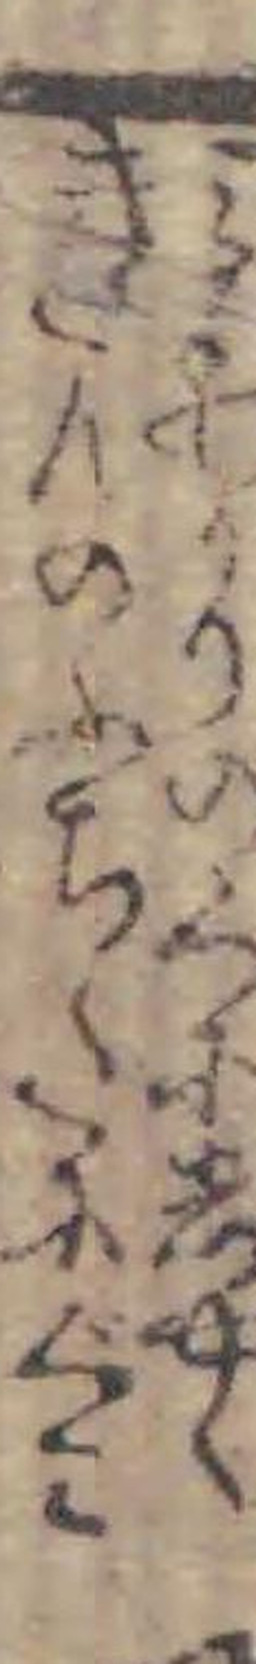きんのふちたにぐみ
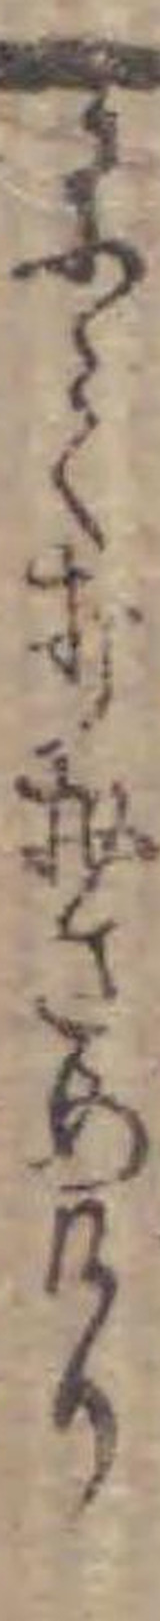にて打おさめけり
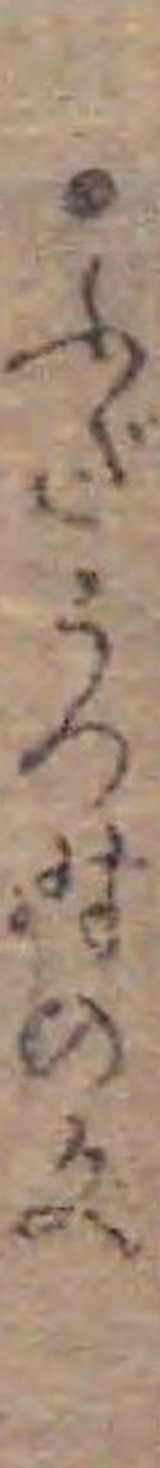・ふだうつ時の文
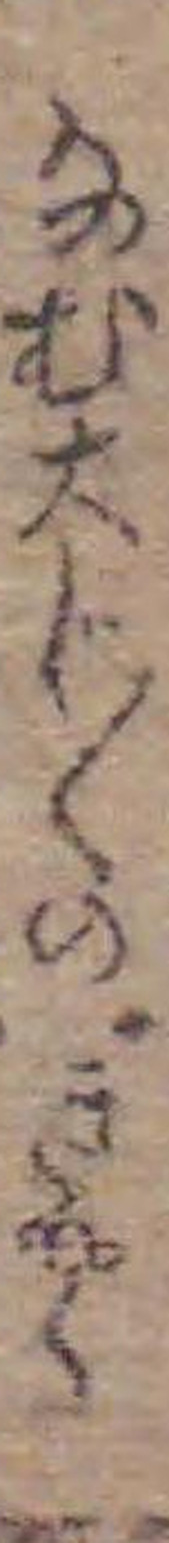なむ大じ〳〵の。きやく
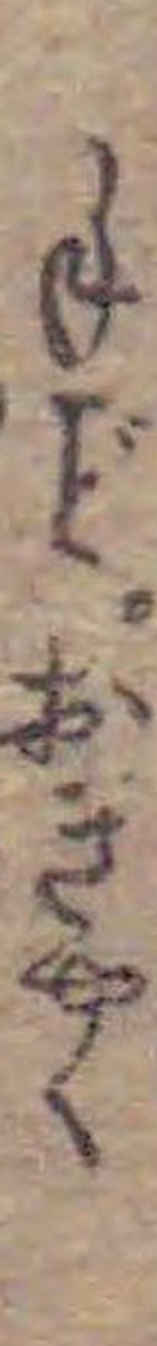手ごと。おきやく
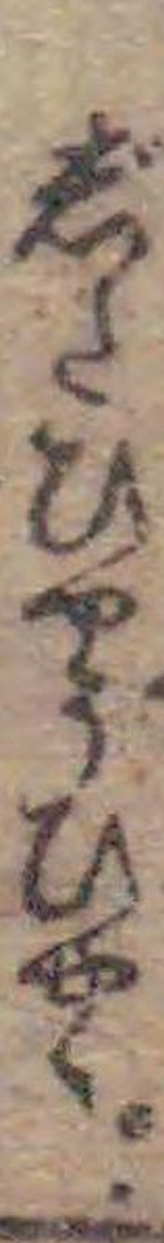じたひやうひゃく。
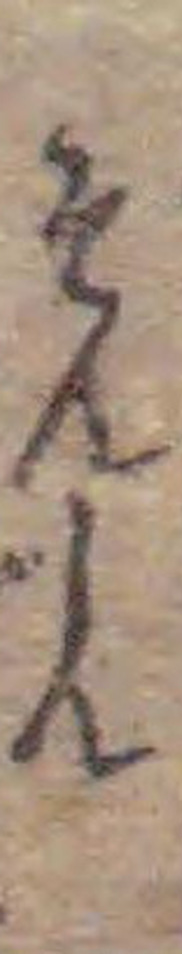そんしん
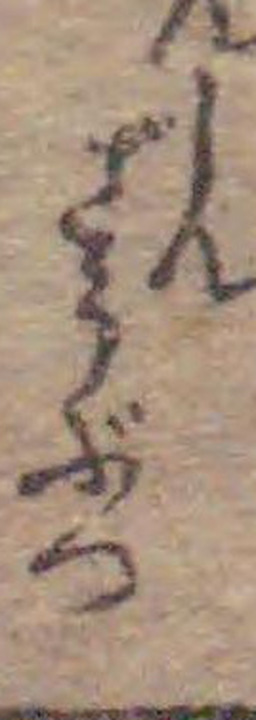ざうぶつ
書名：北国順礼唄方便 : 3巻
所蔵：国立国会図書館 National Diet Library, JAPAN
